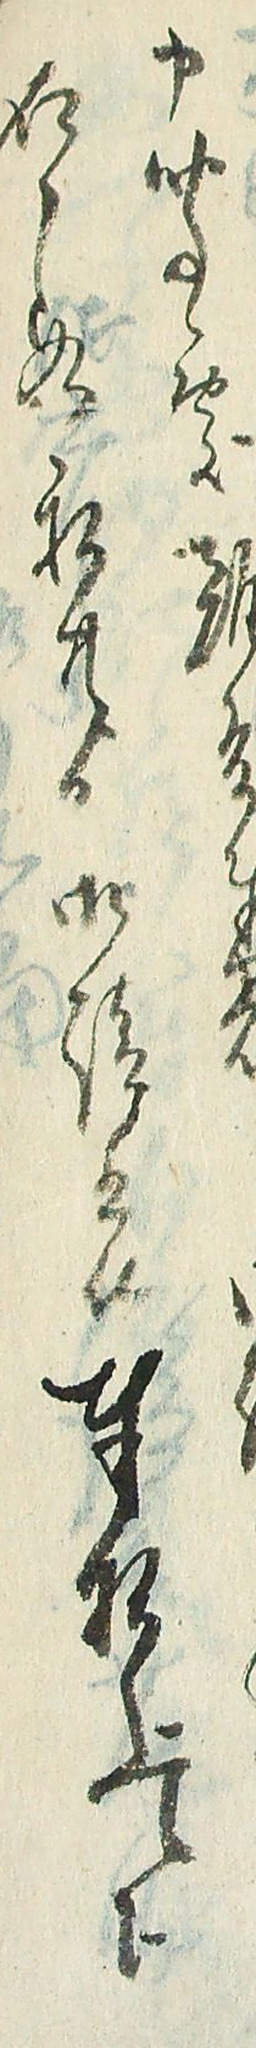右之段私共ゟ御請書仕奉指上候以上

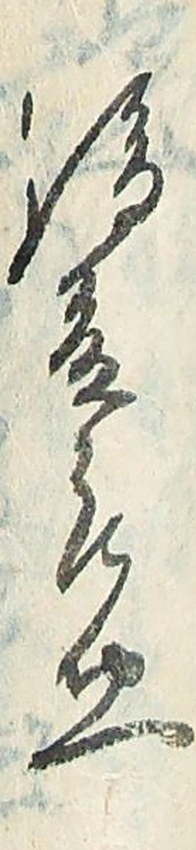後藤庄助
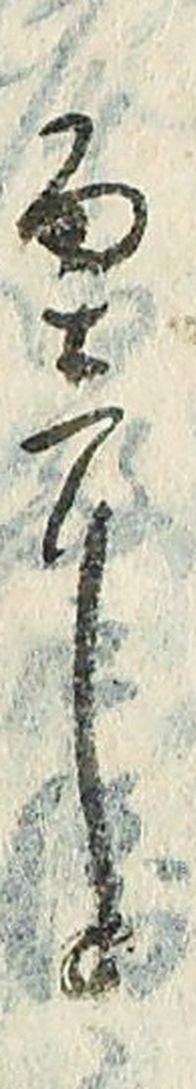酉十二月
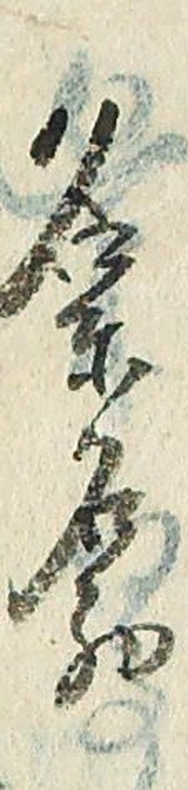名東名西
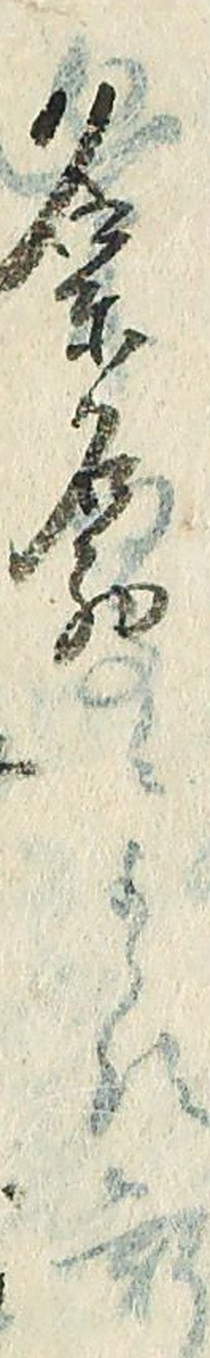名東名西
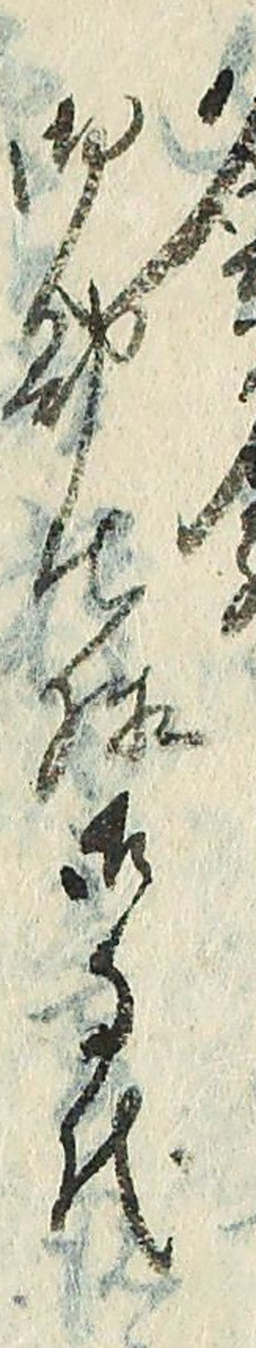御郡代様御手代
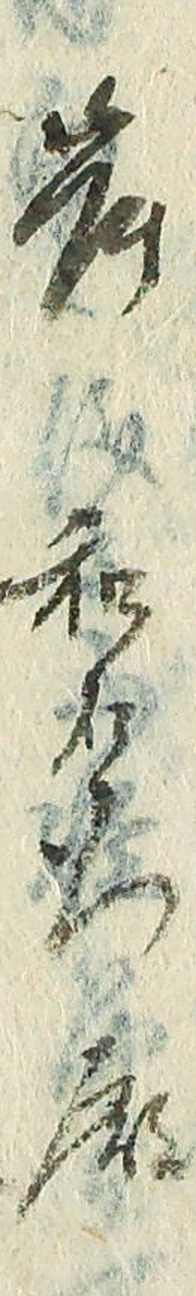岸和左衛門殿
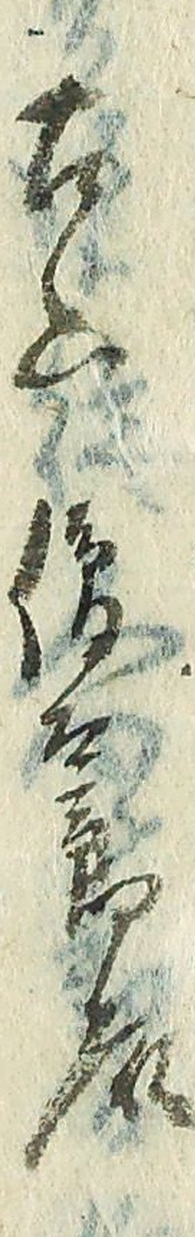古山僧太郎殿
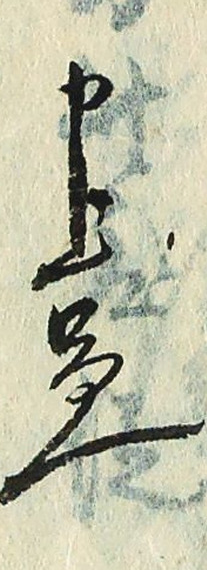申上覚
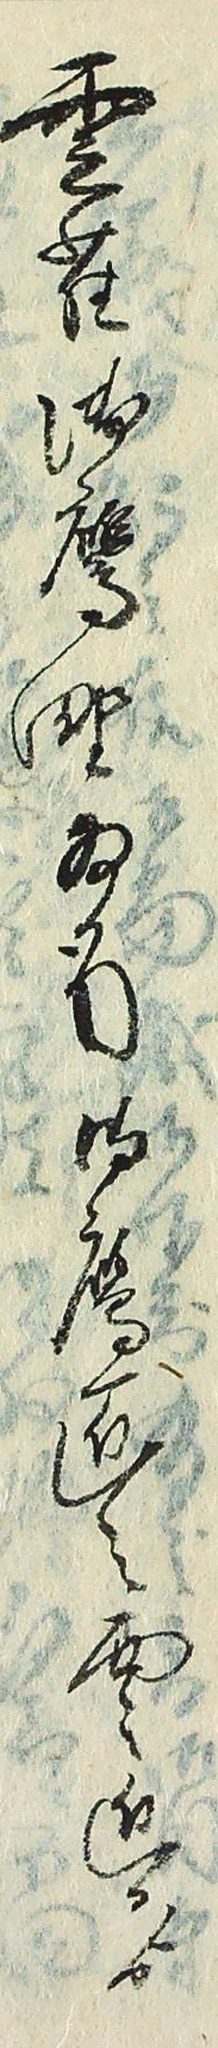雲雀御鷹野為御用御鷹匠之面々近日ゟ
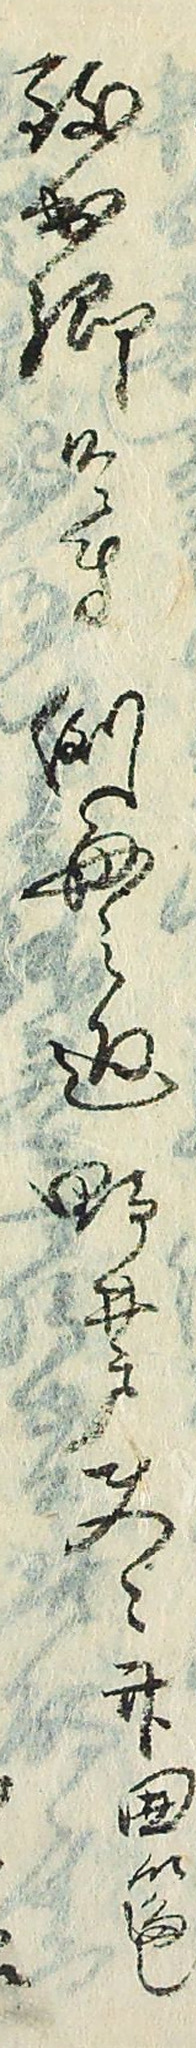致出郷候に付例毎之通野井戸夫々竹囲いたし
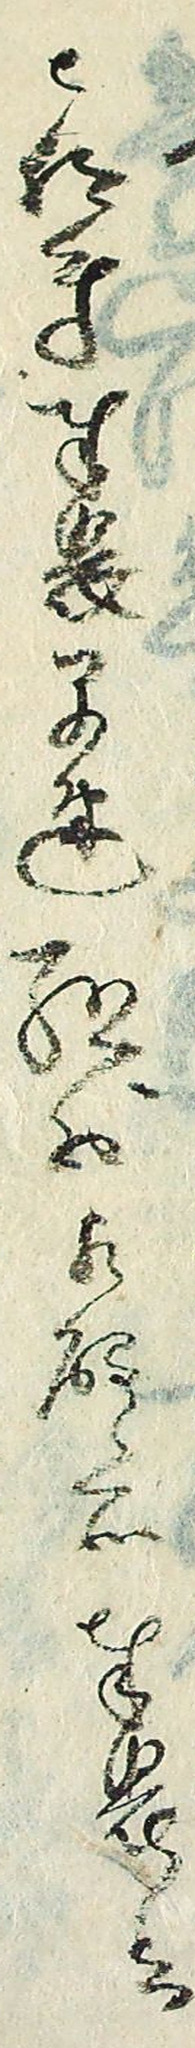被仰付奉畏早速組村相触候所奉畏旨
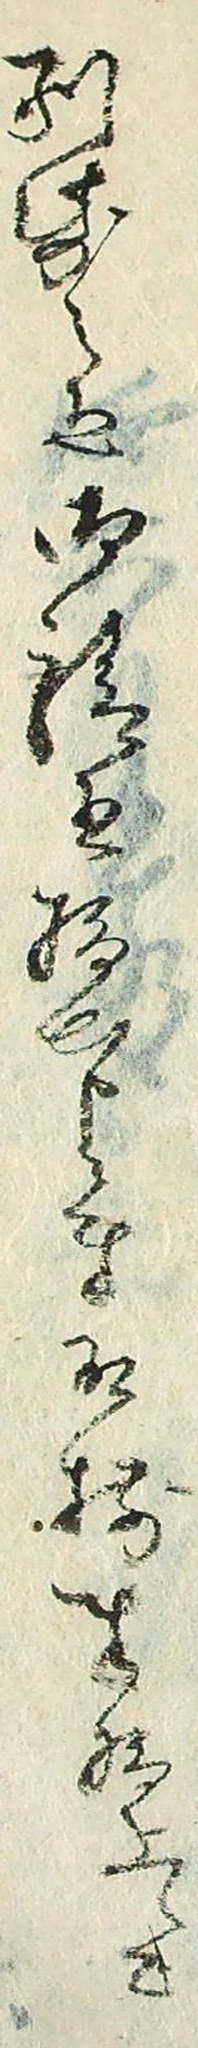別帋之通御請書指出申に付取揃奉指上候以上
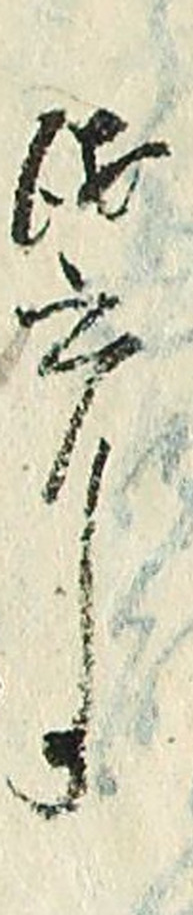戌六月
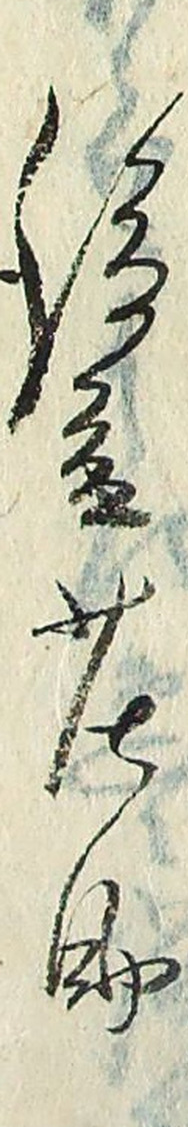後藤庄助
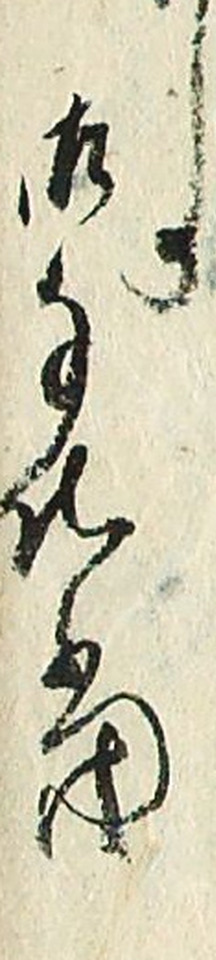御手代当
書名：諸御用御□受書控
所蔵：鳴門教育大学 Naruto University of Education
